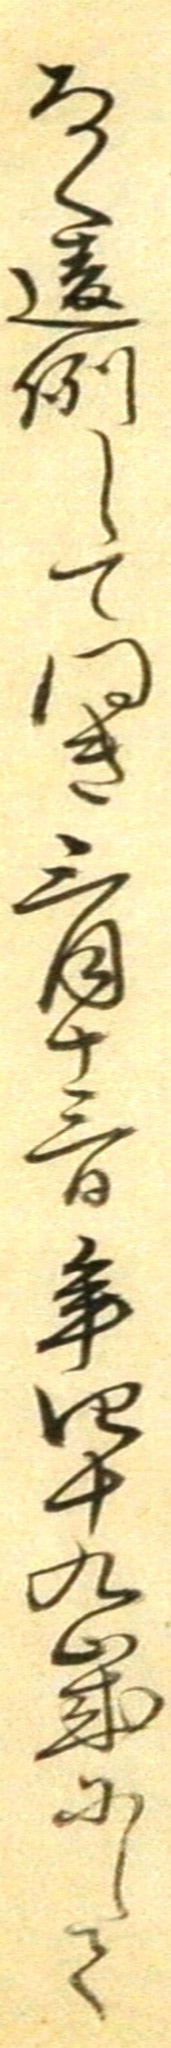なく違例して同き三月十三日年四十九歳にして

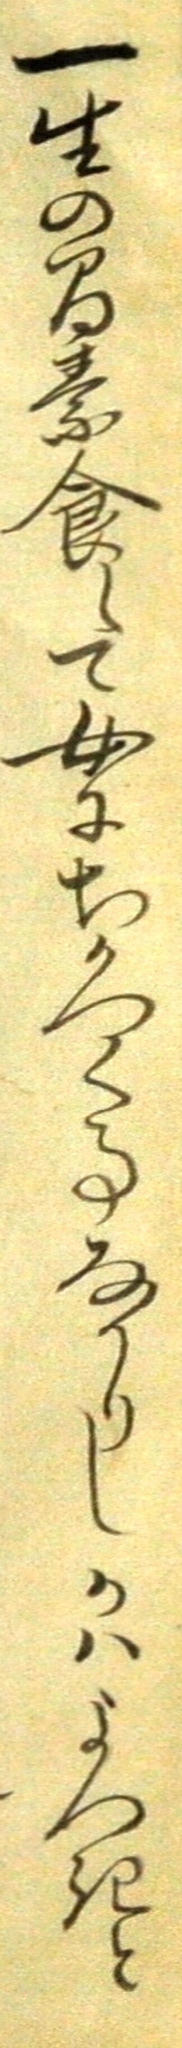一生の間素食して女にちかつく事なかりしかはよつきと

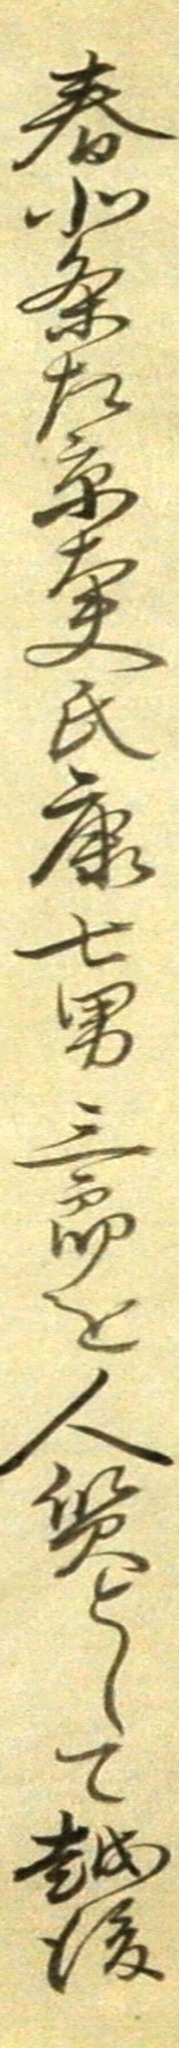春北条左京大夫氏康七男三郎を人質とし越後
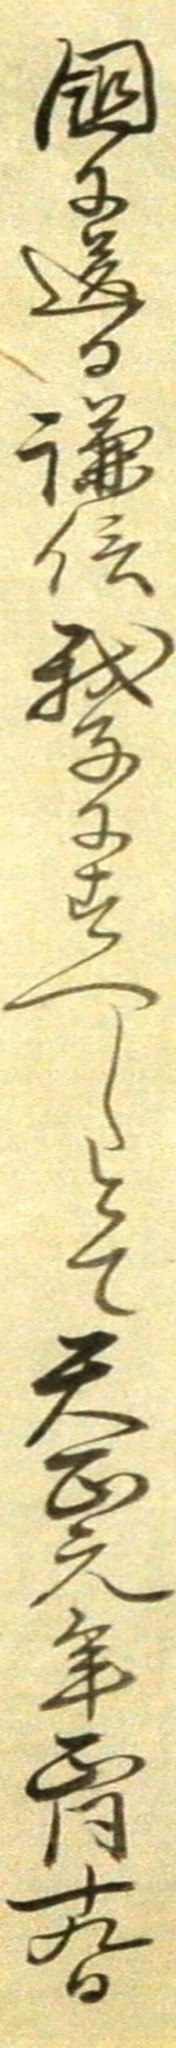国に送る謙信我子にすへしとて天正元年正月十九日
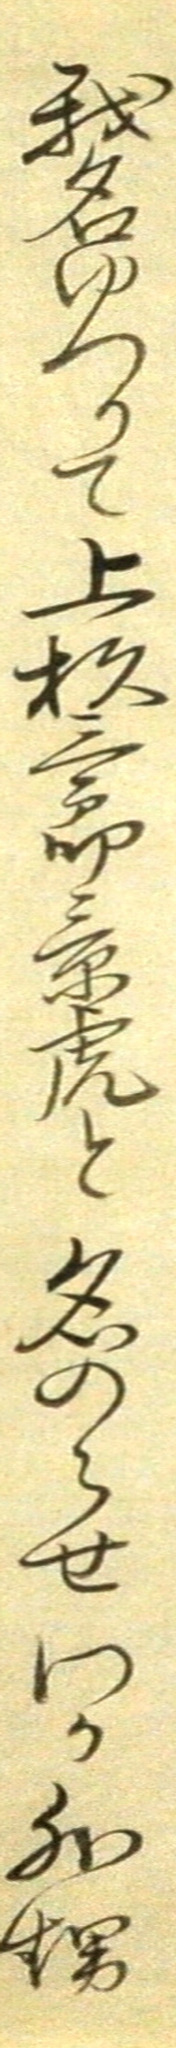我名ゆつりて上杉三郎景虎と名のらせわか外甥
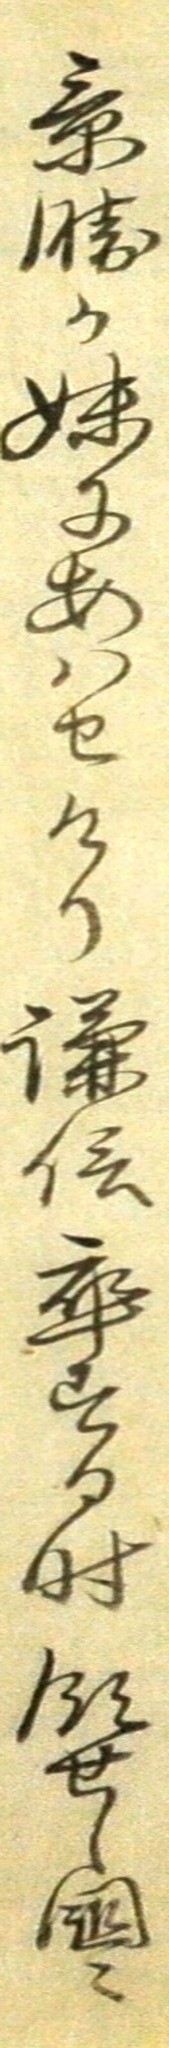景勝か妹にあはせけり謙信卒する時領せし国々
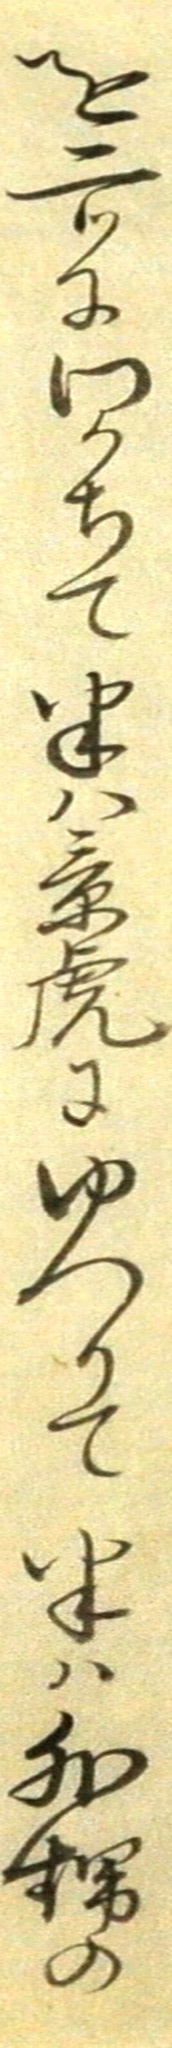を二ッにわかちて半は景虎にゆつりて半は外甥の
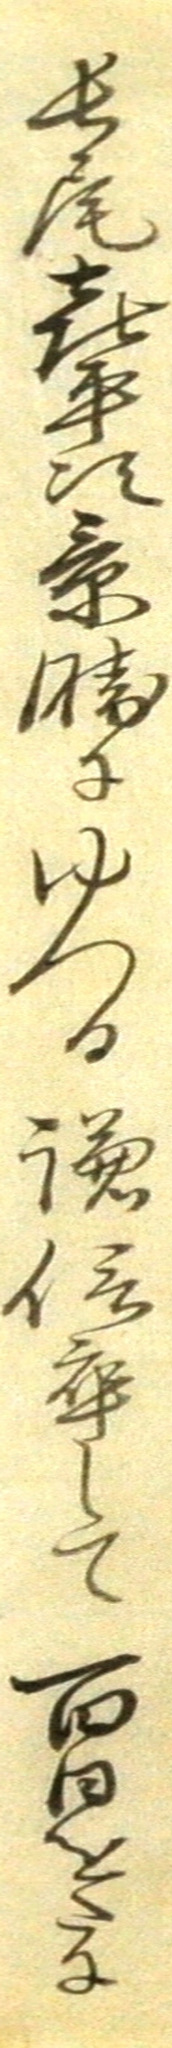長尾喜平次景勝にゆつる謙信卒して百日をたに
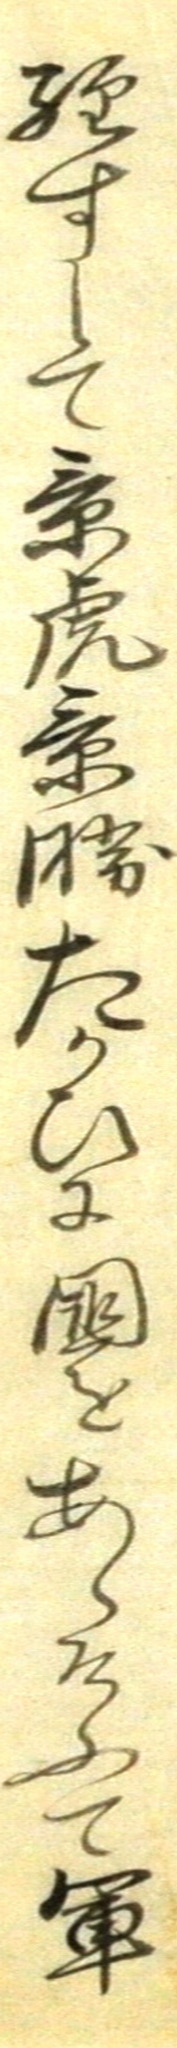経すして景虎景勝たかひに国をあらそふて軍
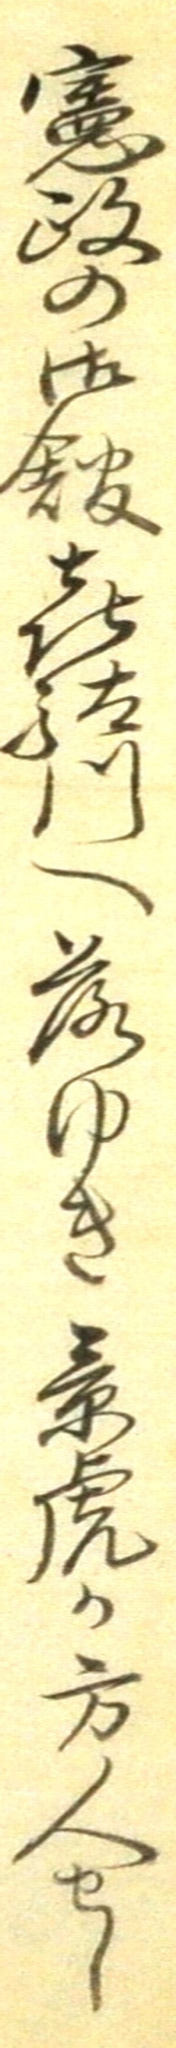憲政の御館喜駄川へ落ゆき景虎か方人せし
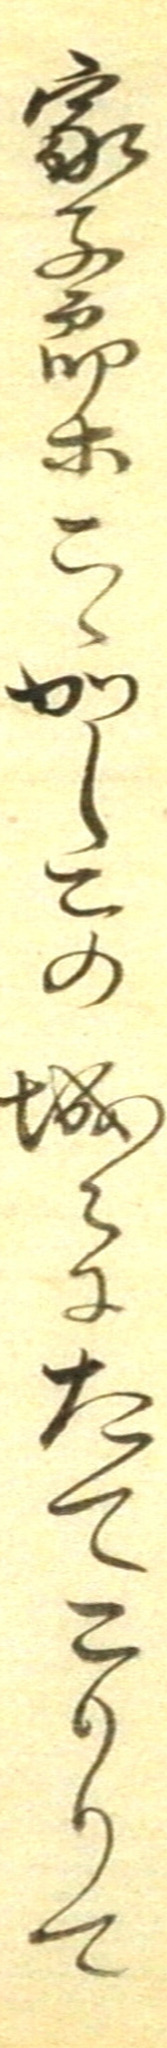家子郎等こゝかしこの城々にたてこもりて
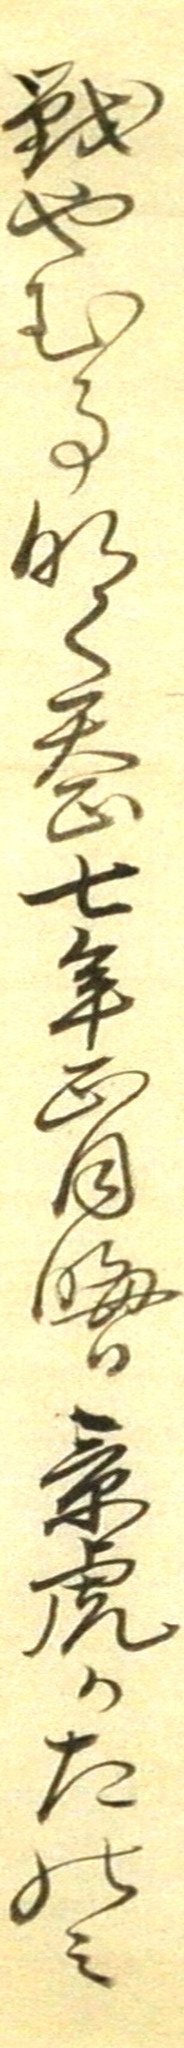戦やむ事なく天正七年正月晦日景虎かたのみ
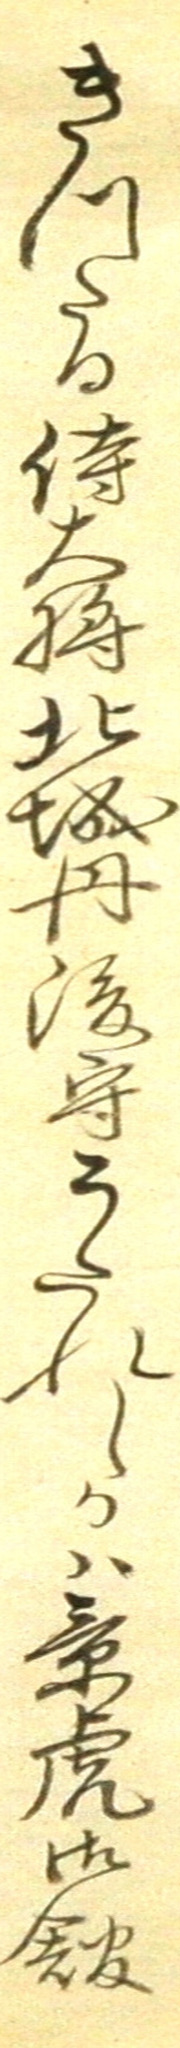きつたる侍大将北条丹後守うたれしかは景虎御館
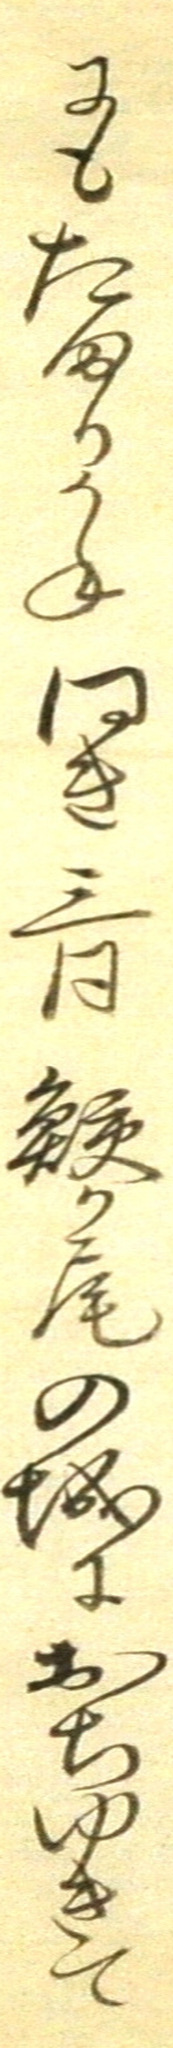にもたまりかね同き三月鮫か尾の城におちゆきて
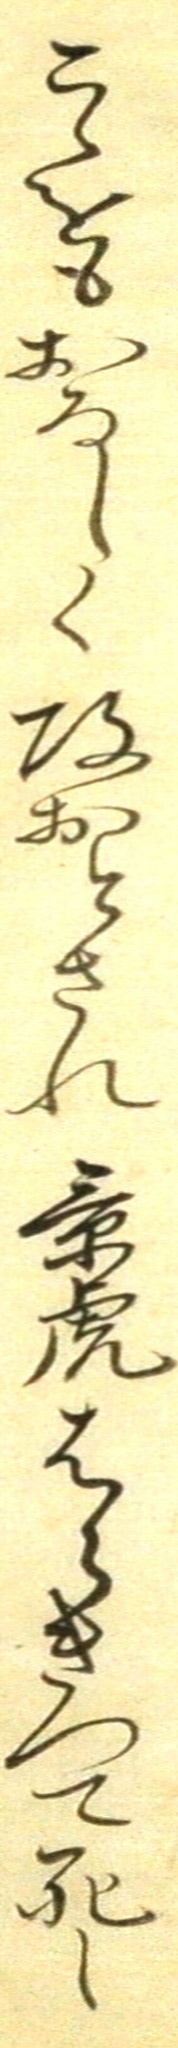こゝをもおなしく攻おとされ景虎はらきつて死し
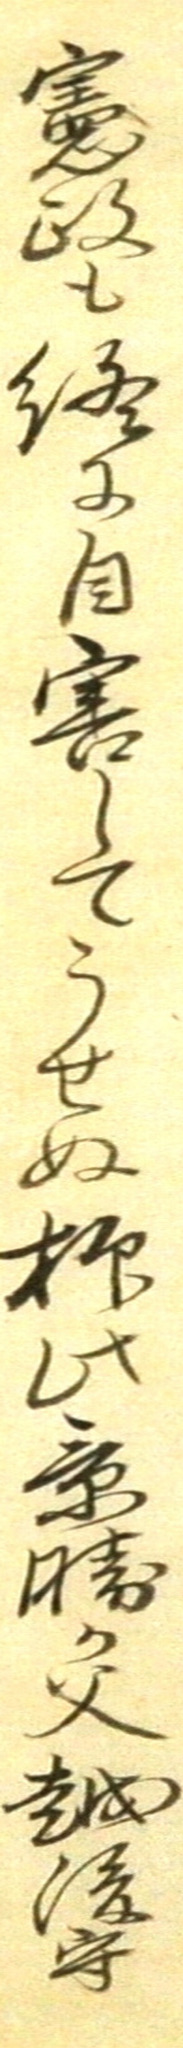憲政も終に自害してうせぬ抑此景勝か父越後守
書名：藩翰譜（八・下）
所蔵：伊那市立高遠町図書館・合同会社AMANE
